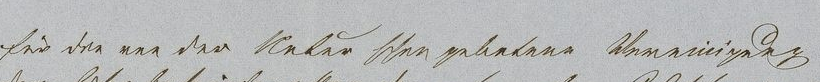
für die von der Natur schon gebotene Vereinigung
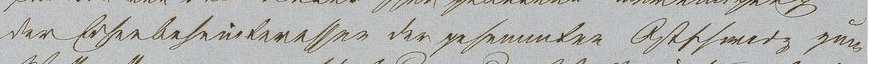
der Eisenbahninteressen der gesammten Ostschweiz zum
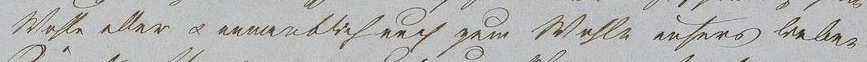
Wohle aller & namentlich auch zum Wohle unsers lieben
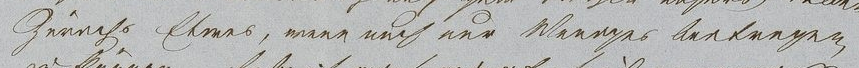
Zürichs Etwas, wenn auch nur Weniges beitragen
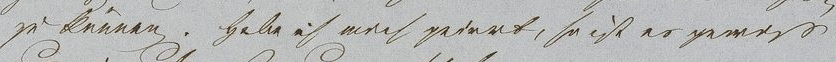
zu können. Habe ich mich geirrt, so ist es gewiß
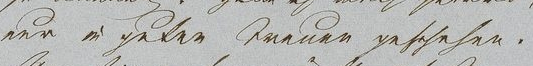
nur in guten Treuen geschehen.
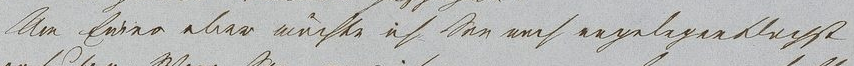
Um Eines aber möchte ich Sie noch angelegentlichst
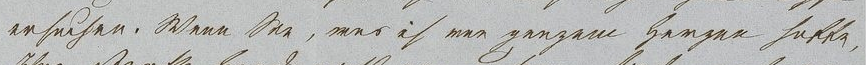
ersuchen. Wenn Sie, was ich von ganzem Herzen hoffe,
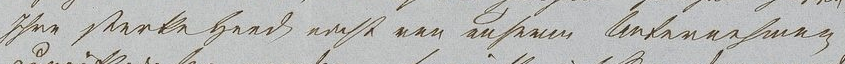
Ihre starke Hand nicht von unserm Unternehmen
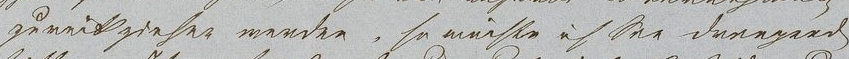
zurückziehen werden, so möchte ich Sie dringend
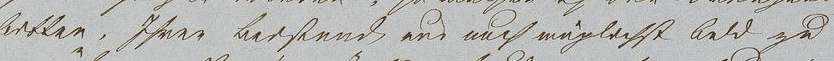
bitten, Ihren Beistand uns auch möglichst bald zu
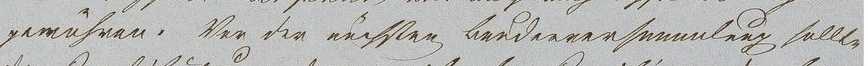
gewähren. Vor der nächsten Bundesversammlung sollte
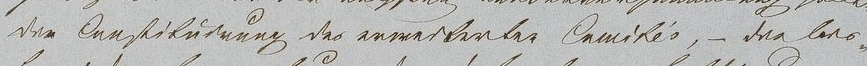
die Constituirung der erweiterten Comités, – die bis-
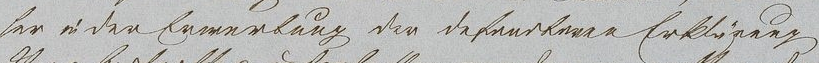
her in der Erwartung der definitiven Erklärung
